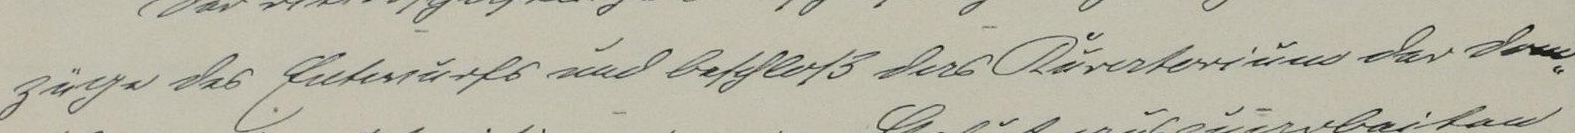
züge des Entwurfs und beschloß das Kuratorium der Dom-
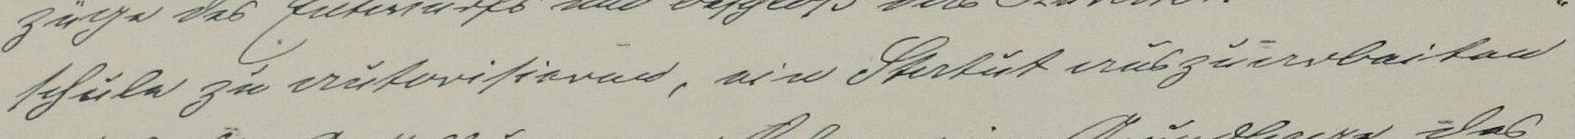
schule zu autorisieren, ein Statut auszuarbeiten
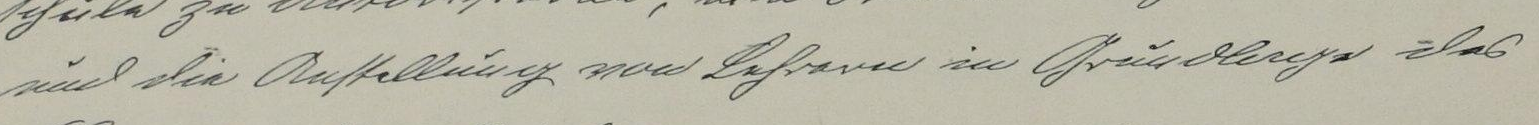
und die Anstellung von Lehrern in Grundlage des
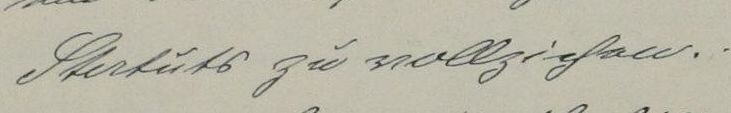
Statuts zu vollziehen.
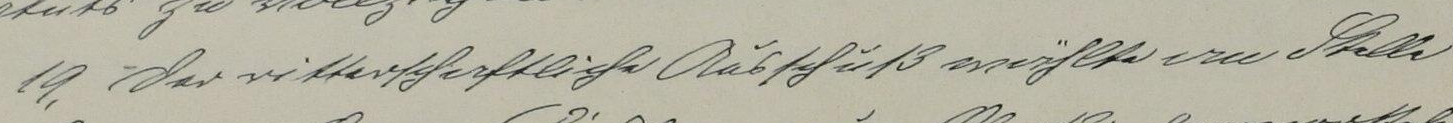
19. Der ritterschaftliche Ausschuß wählte an Stelle
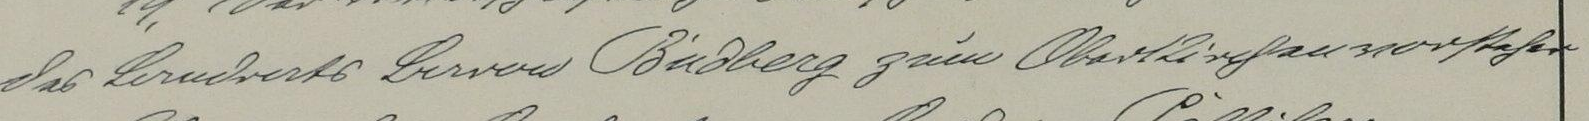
des Landrats Baron Budberg zum Oberkirchenvorsteher
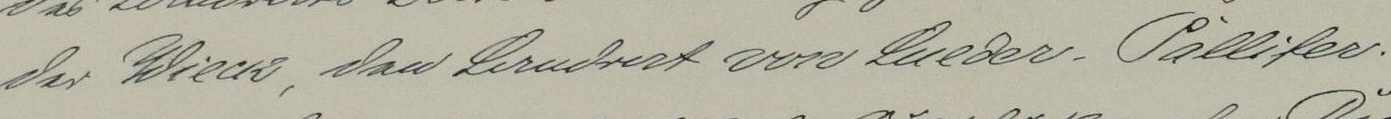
der Wieck den Landrat von Lueder-Pallifer.
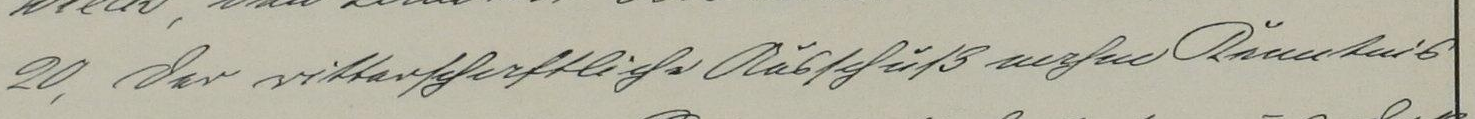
20. Der ritterschaftliche Ausschuß nahm Kenntnis
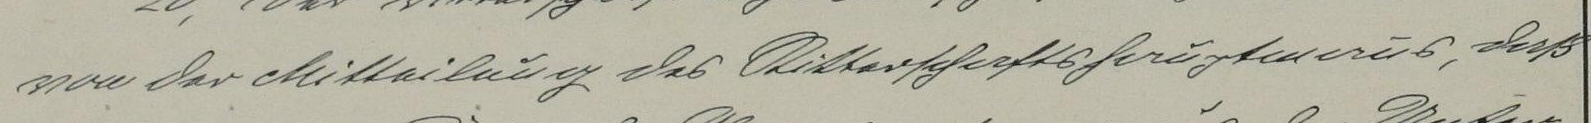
von der Mitteilung des Ritterschaftshauptmanns, daß
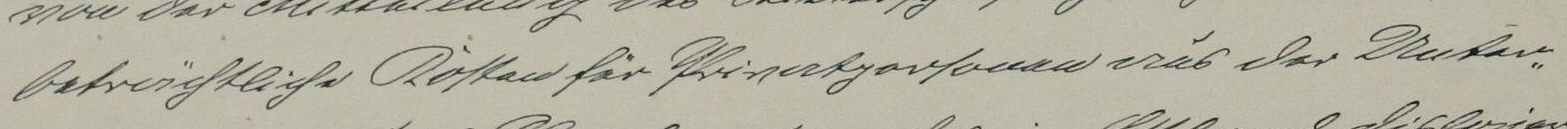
beträchtliche Kosten für Privatpersonen aus der Unter-
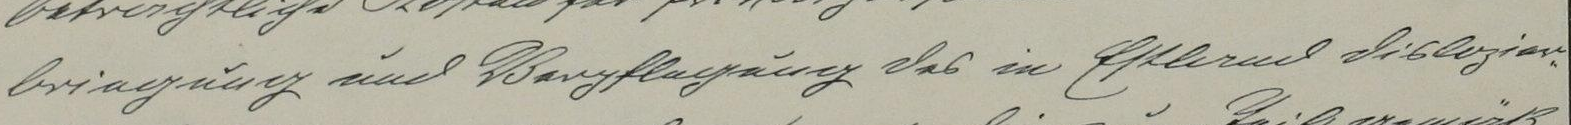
bringung und Verpflegung des in Estland dislozier-
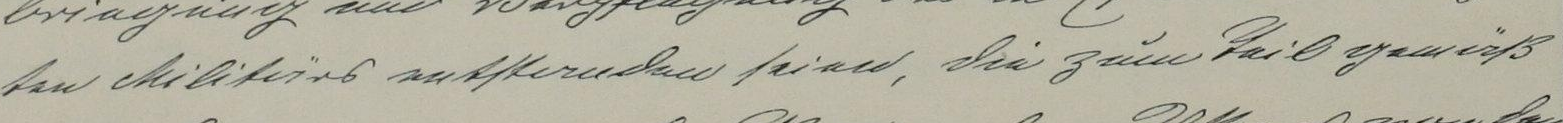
ten Militärs entstanden seien, die zum Teil gemäß
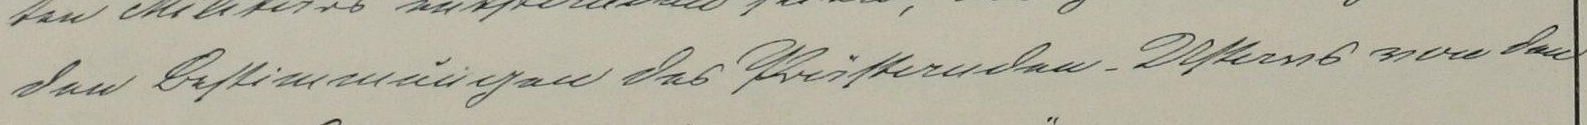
den Bestimmungen des Prästanden-Ustavs von den
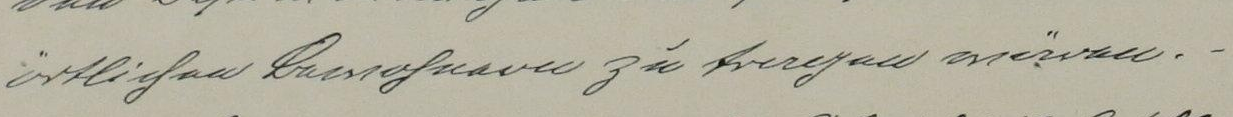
örtlichen Bewohnern zu tragen wären.
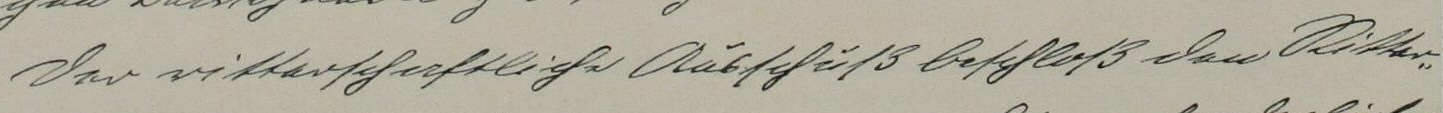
Der ritterschaftliche Ausschuß beschloß den Ritter-
